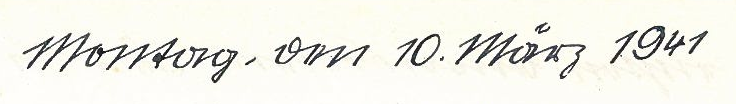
Montag, den 10. März 1941
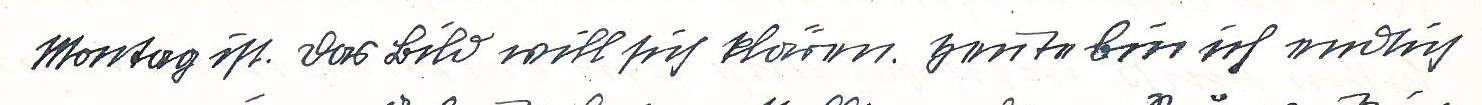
Montag ist. Das Bild will sich klären. Heute bin ich endlich
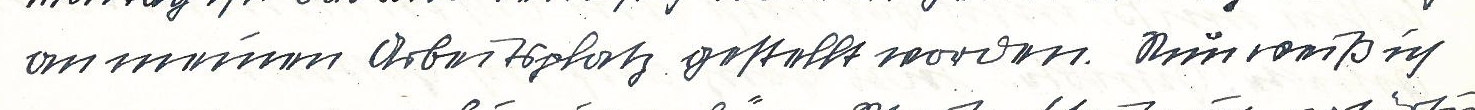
an meinen Arbeitsplatz gestellt worden. Nun weiß ich
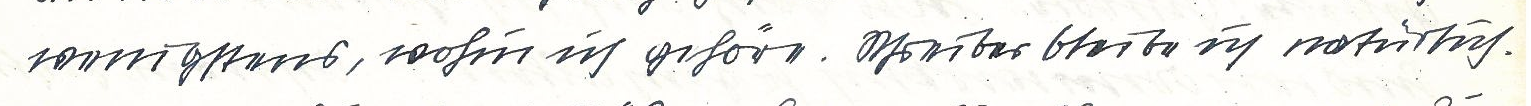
wenigstens, wohin ich gehöre. Schreiber bleibe ich natürlich.
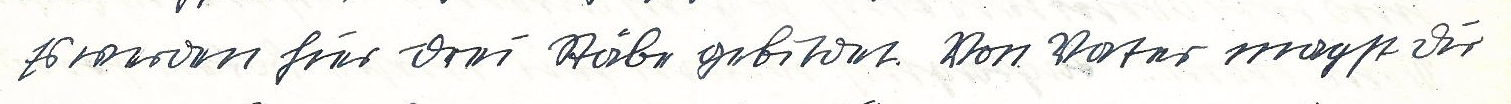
Es werden hier drei Stäbe gebildet. Von Vater magst Dir
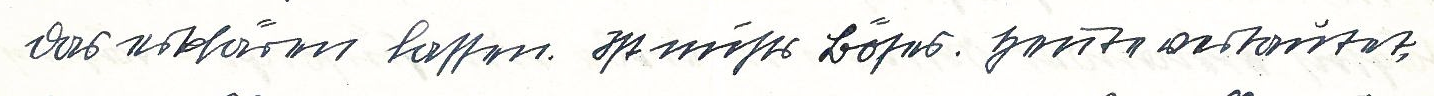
das erklären lassen. Ist nichts Böses. Heute verlautet,
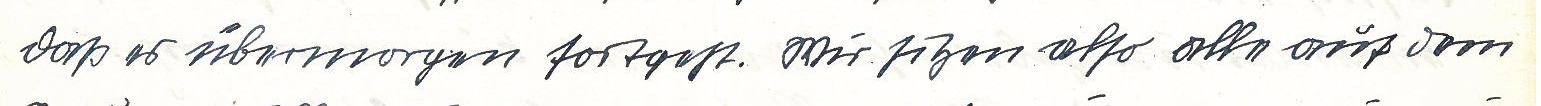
daß es morgen fortgeht. Wir sitzen also alle auf dem
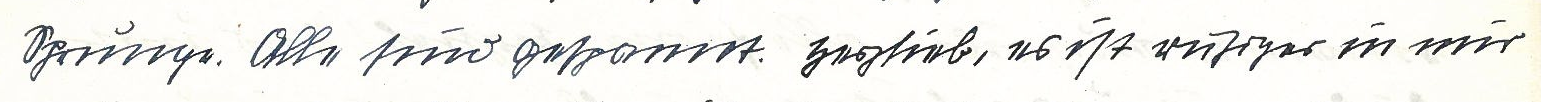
Sprunge. Alle sind gespannt. Herzlieb, es ist ruhiger in mir
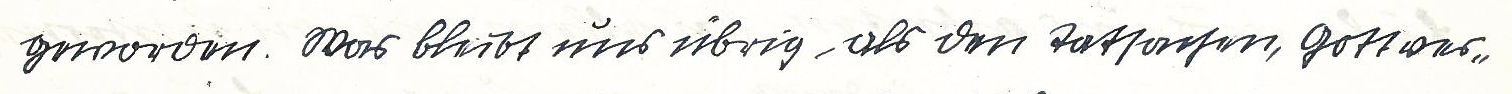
geworden. Was bleibt uns übrig, als den Tatsachen, Gott ver¬
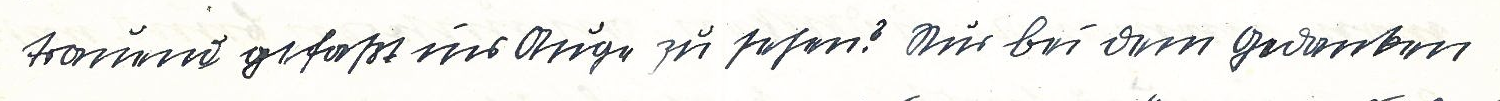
trauend, gefaßt ins Auge zu sehen? Nur bei dem Gedanken
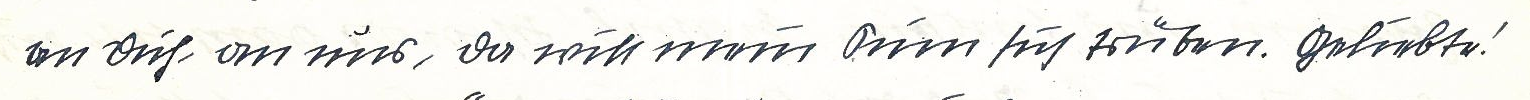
an Dich, an uns, da will mein Sinn sich trüben. Geliebte!
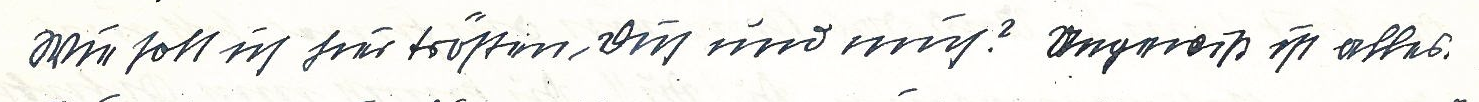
Wie soll ich hier trösten, Dich und mich? Ungewiß ist alles.
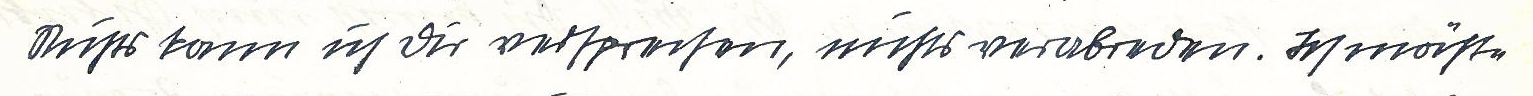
Nichts kann ich Dir versprechen, nichts verabreden. Ich möchte
